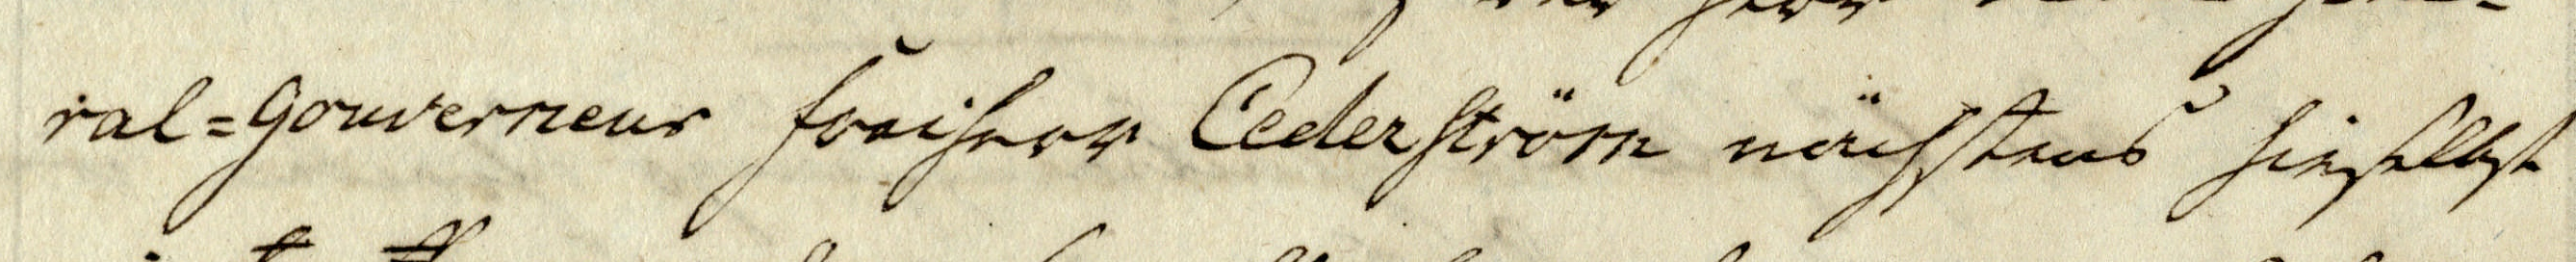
ral Gouverneur Freiherr Cederström nächstens hieselbst
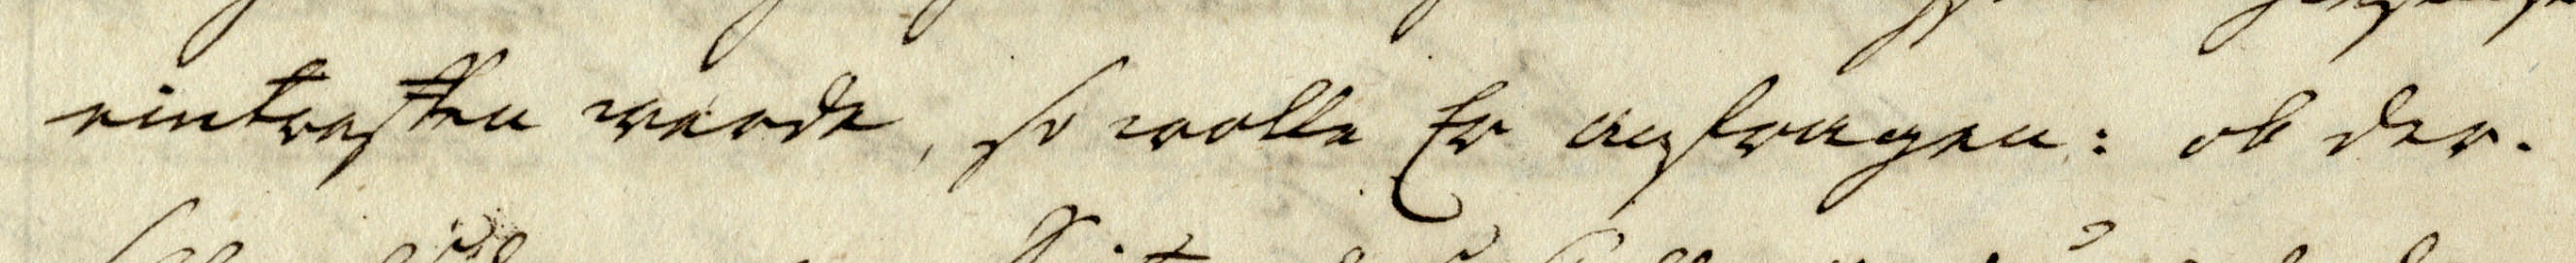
eintreffen werde, so wolle Er anfragen: ob der¬
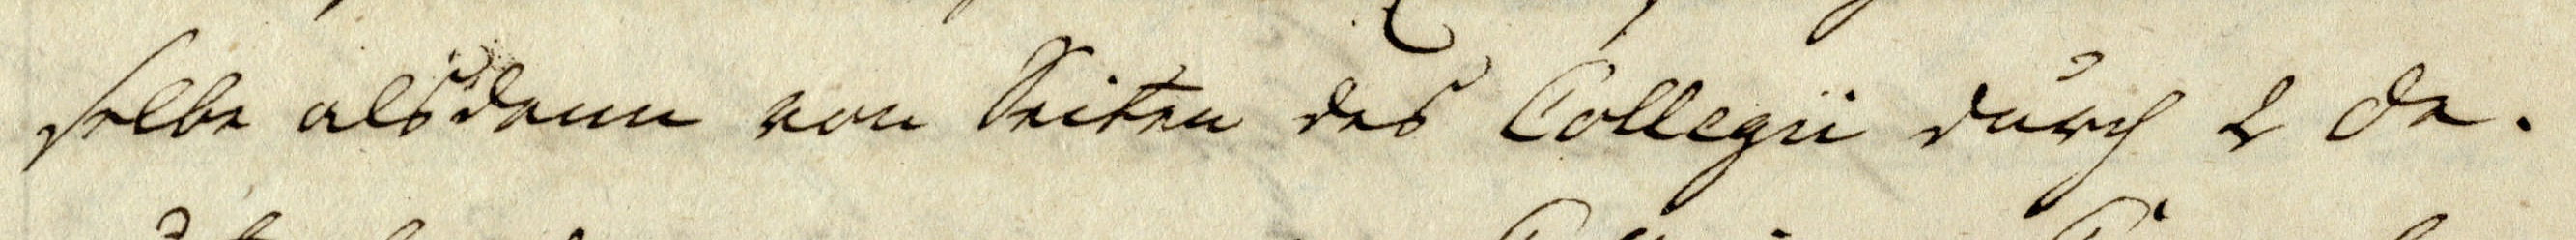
selbe alsdenn von Seiten des Collegii durch 2 De¬
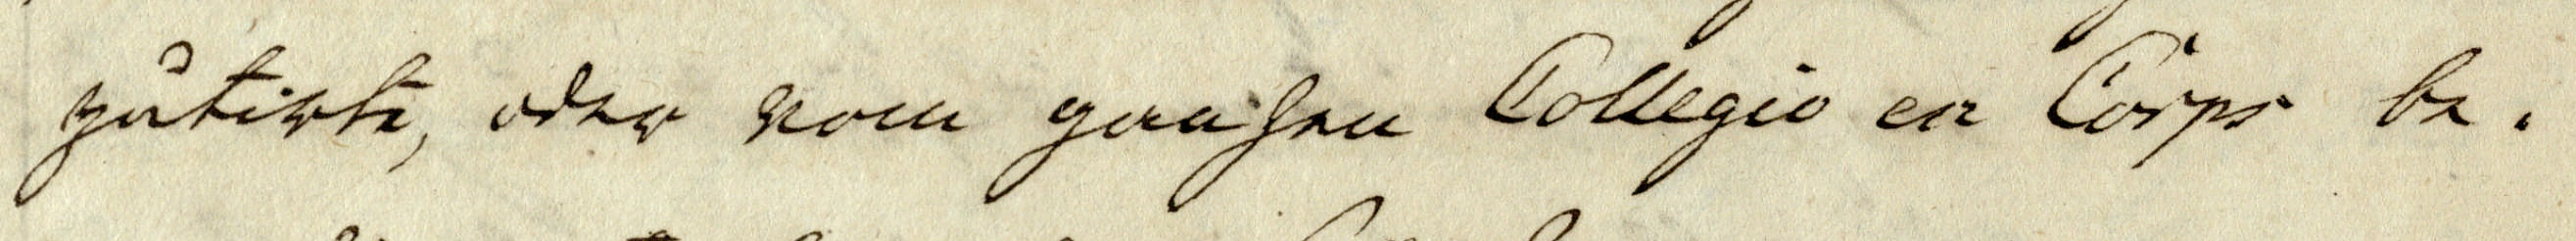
putirte, oder vom ganzen Collegio en Corps be¬
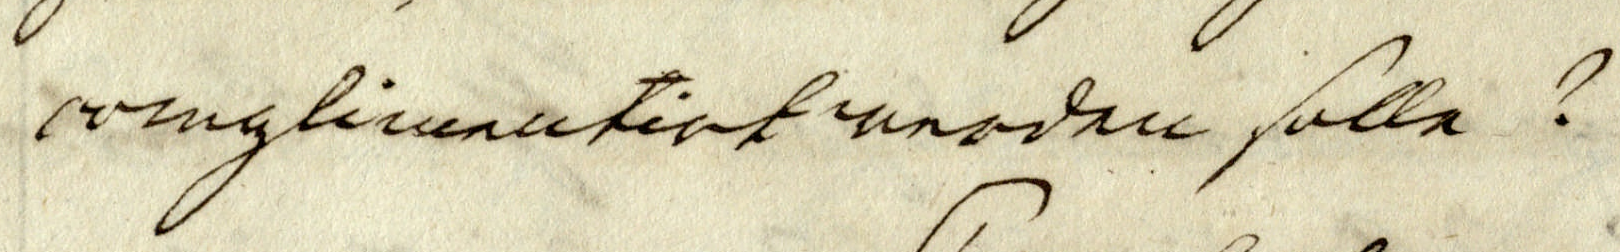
complimentirt werden solle?
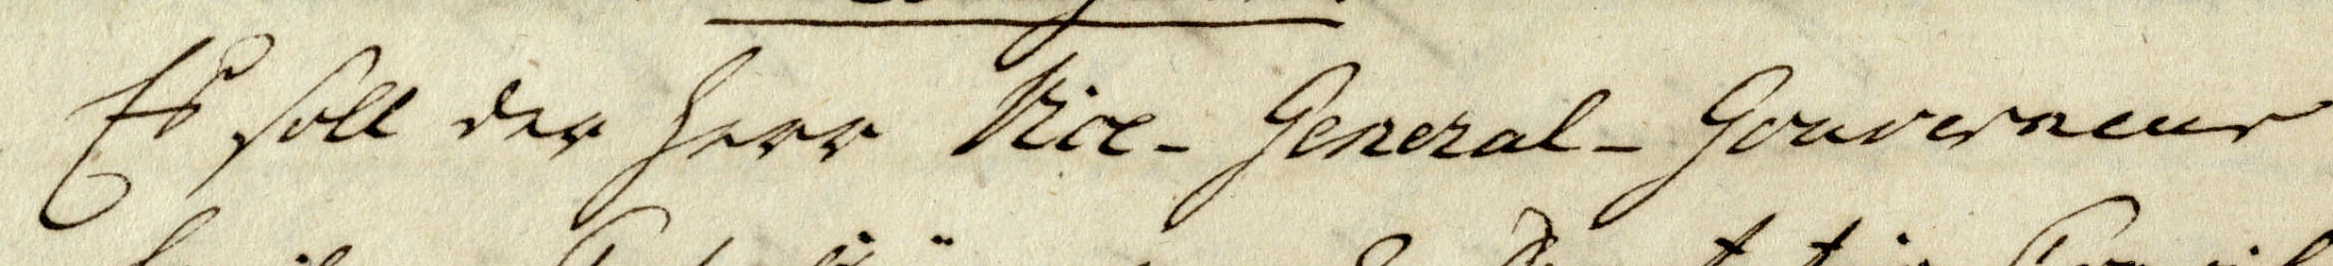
Es soll der Herr Vice- General- Gouverneur
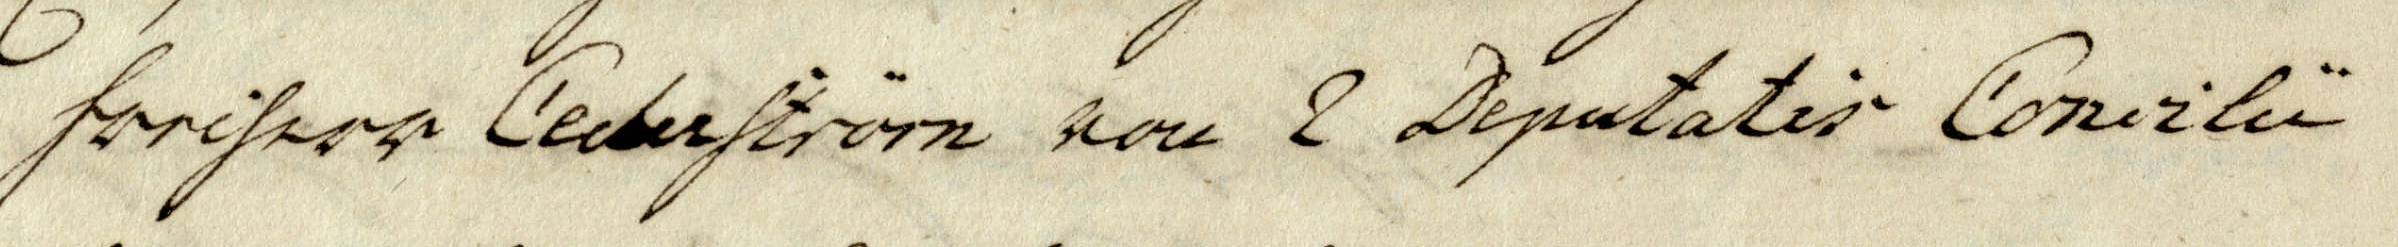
Freiherr Cederström von 2 Deputatis Concilii
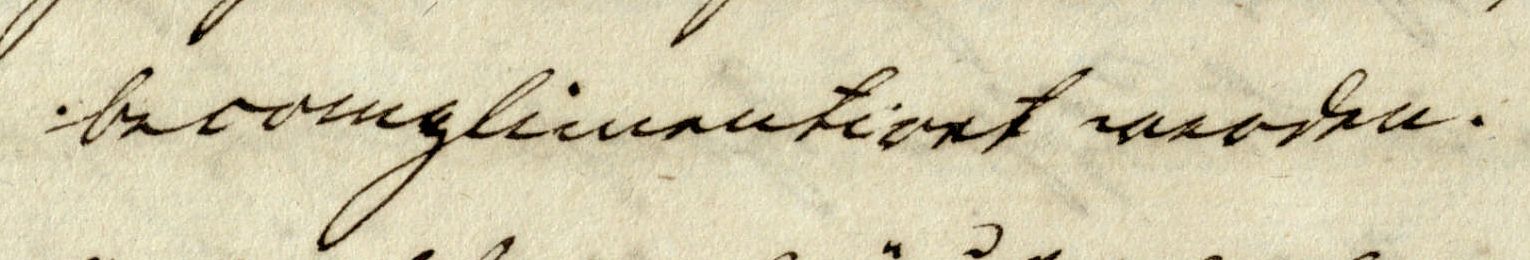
becomplimentiret werden.
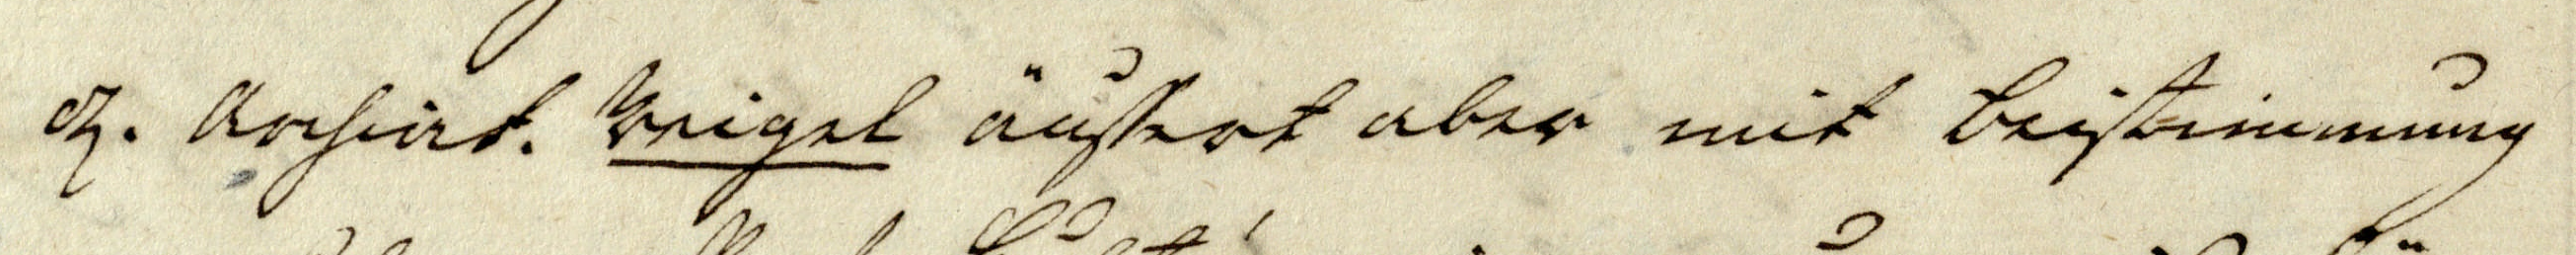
dh. Archiat. Weigel äussert aber mit Bestimmung
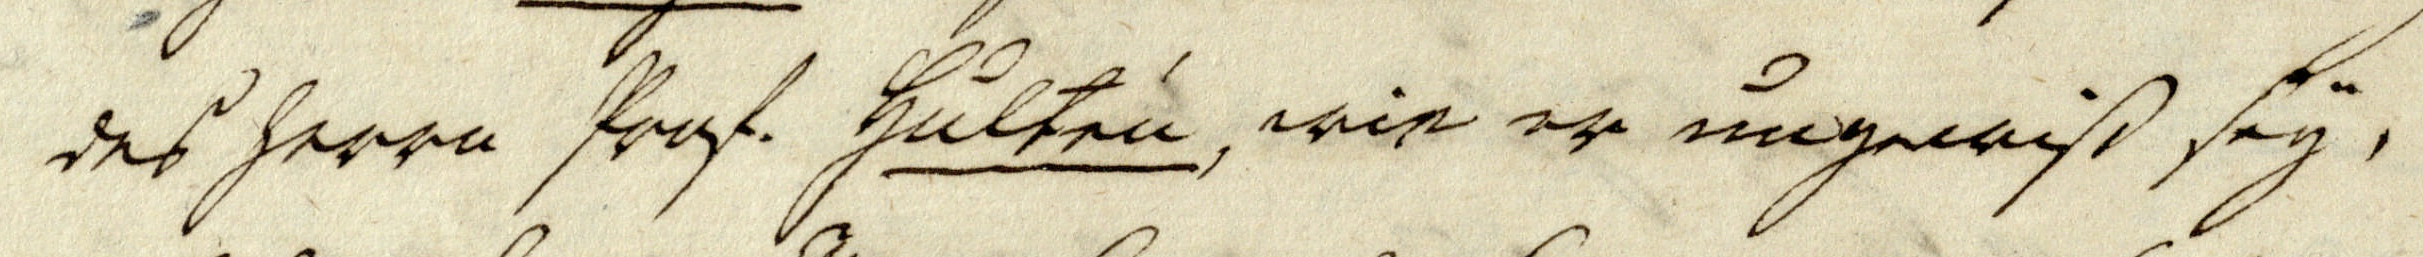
des Herrn Prof. Hultén, wie er ungewiß seÿ,
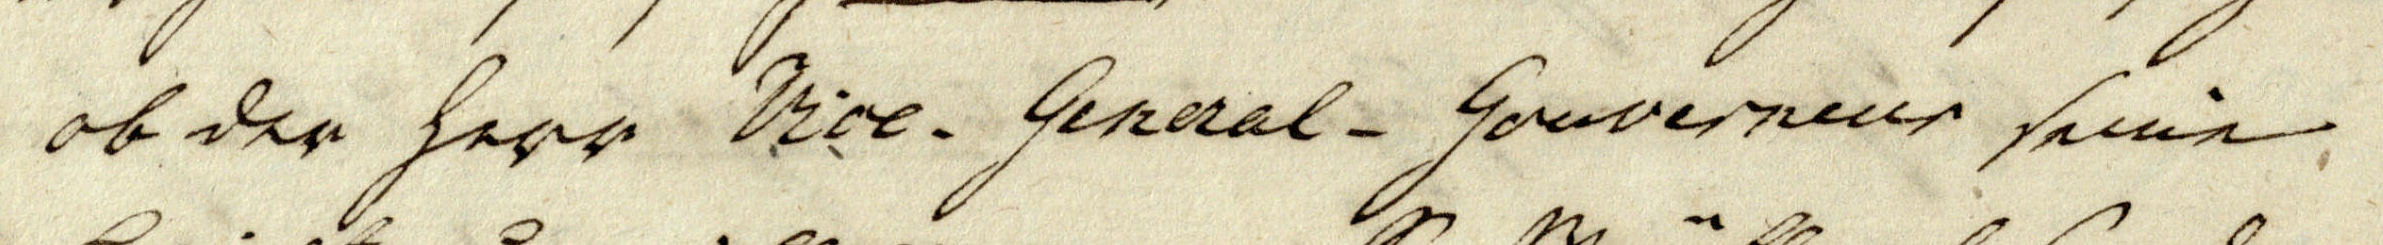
ob der Herr Vice- General- Gouverneur seine
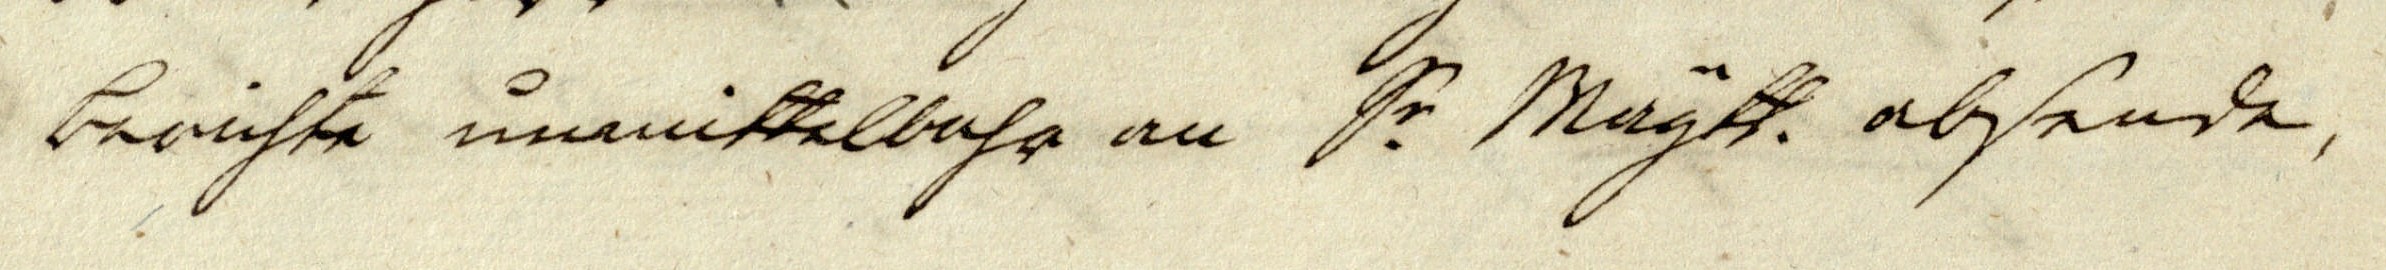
Berichte ummittelbahr an Sr Maÿtt. absende,
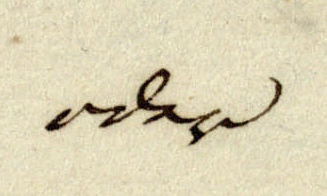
oder
